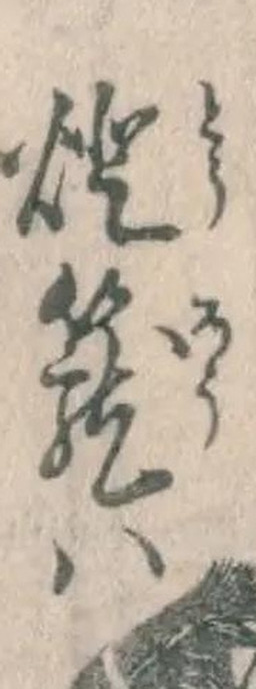燈籠は
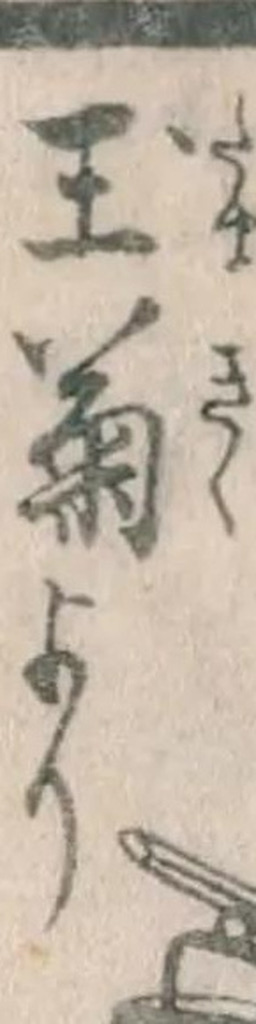玉菊より
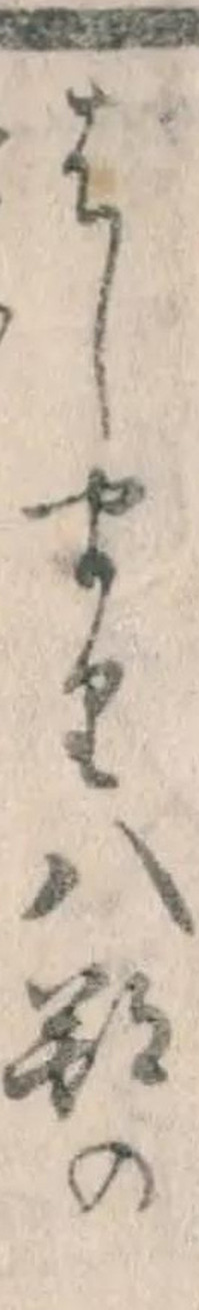はしまり八朔の
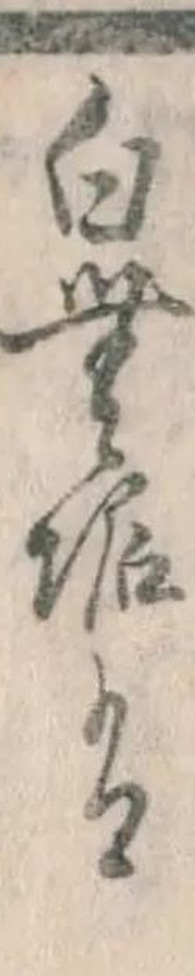白無垢は
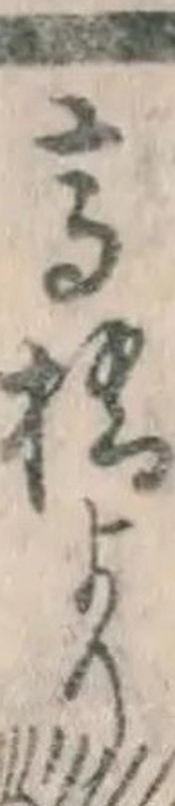高橋より
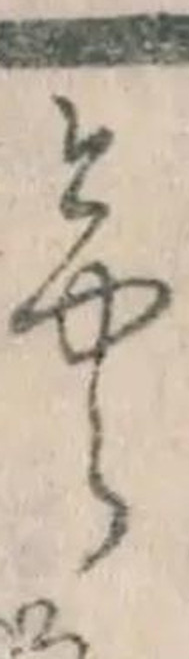とやら
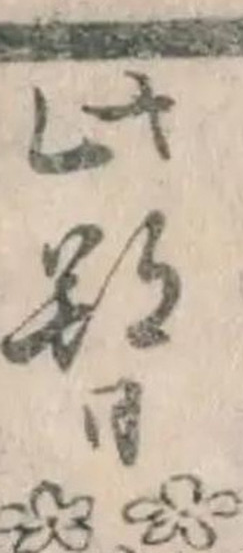此朔日
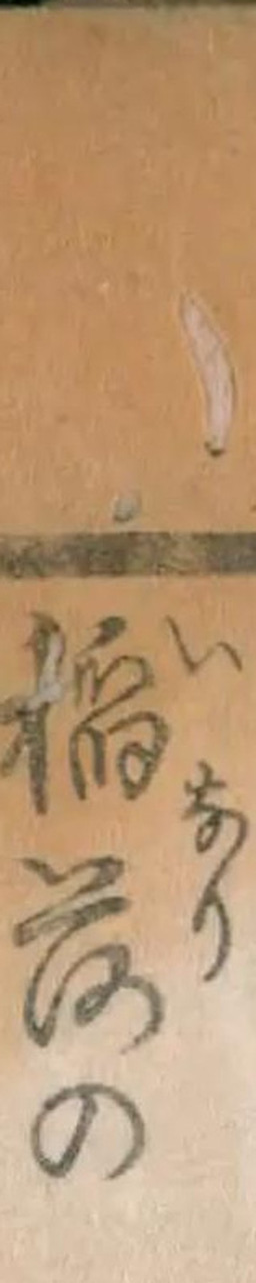稲荷の
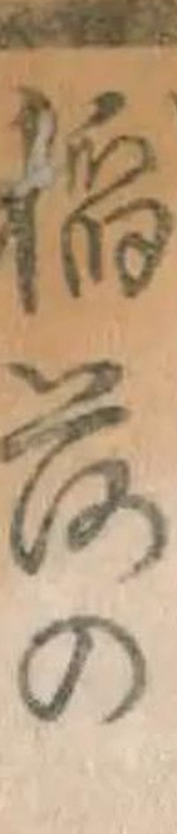稲荷の
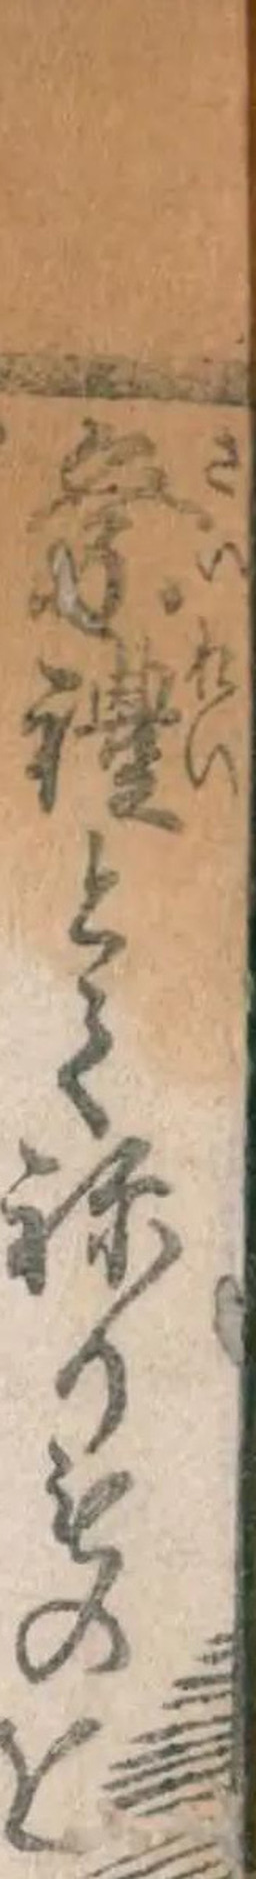祭礼とてねりものを
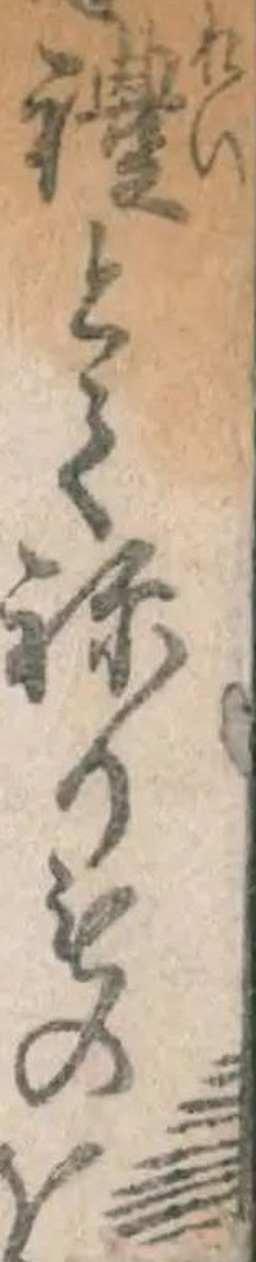祭礼とてねりものを
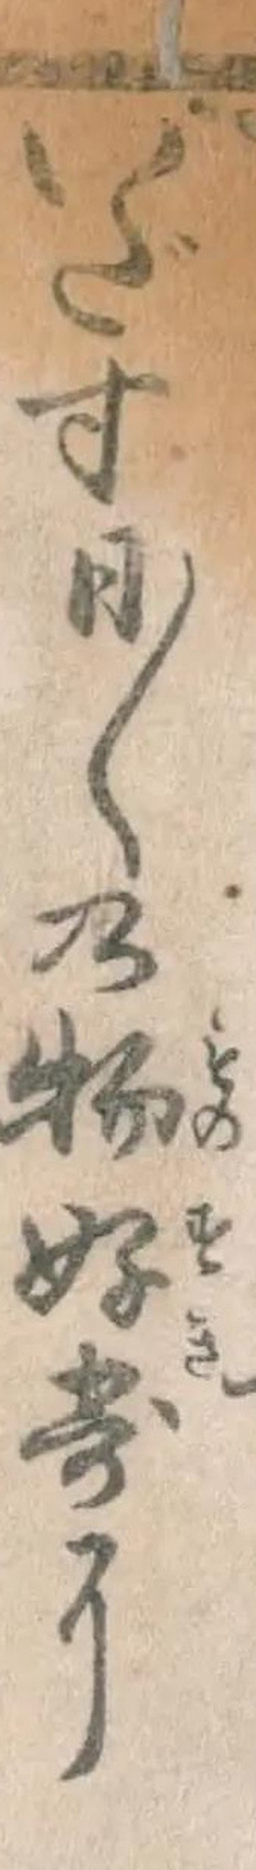いだす日〳〵の物好寄に
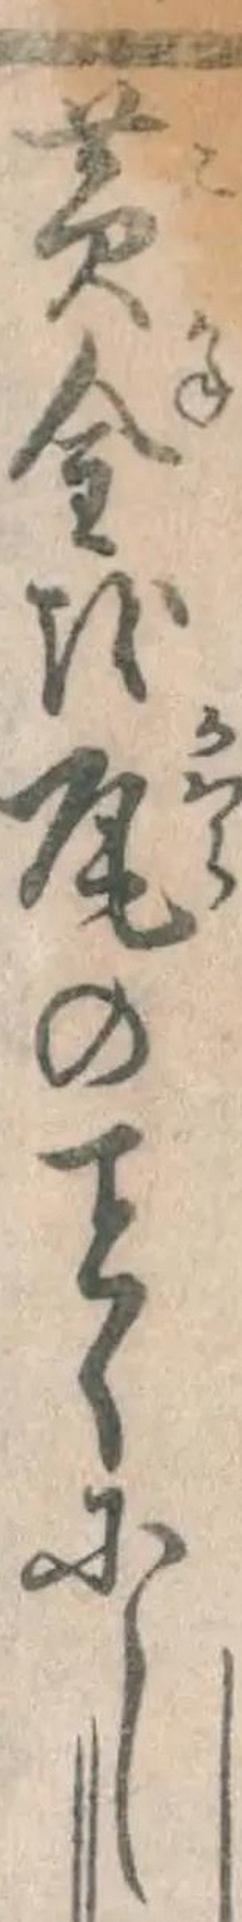黄金を瓦のことくにし
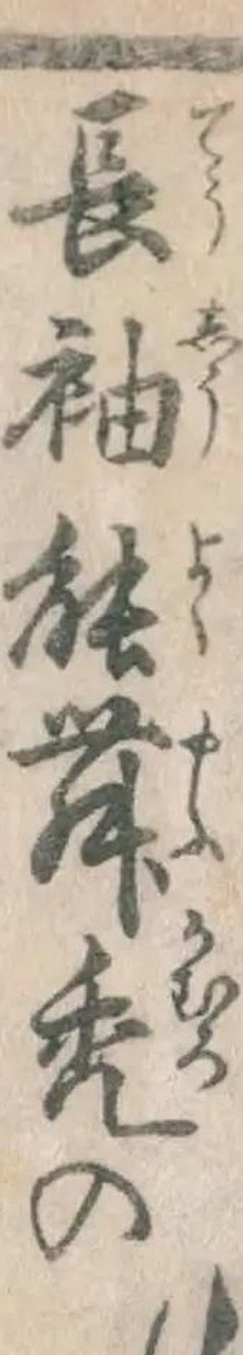長袖能舞禿の
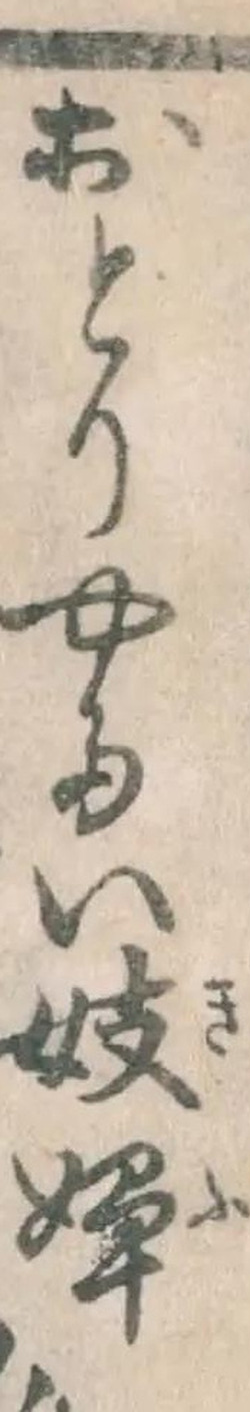おとりやたい妓婦
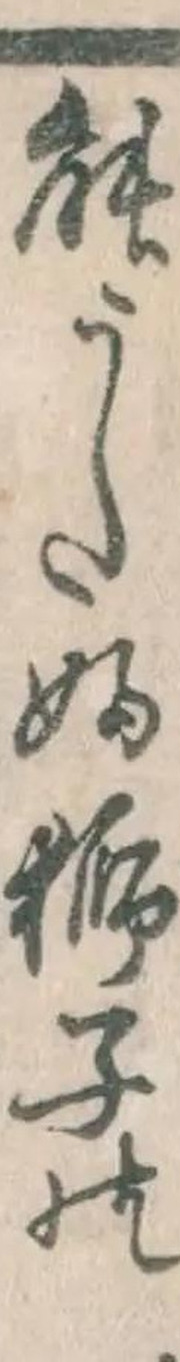のうたふ獅子の
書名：絵本物見岡
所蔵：国立国会図書館 National Diet Library, JAPAN
